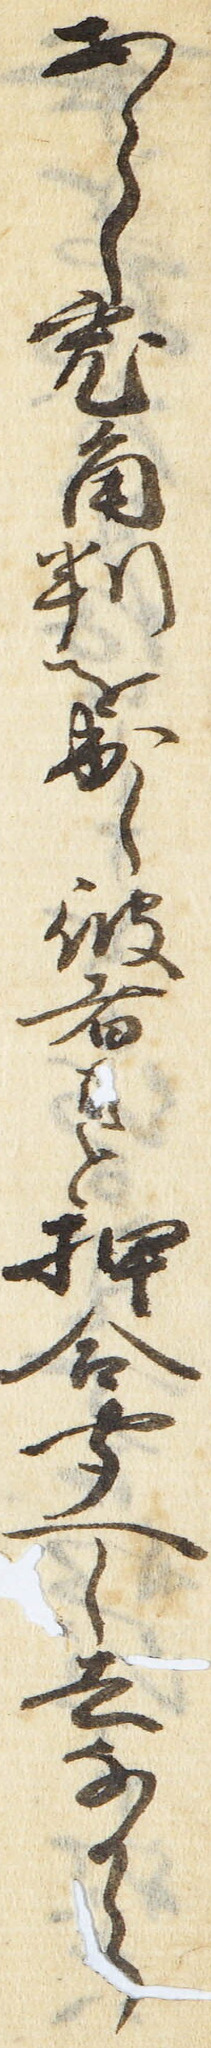あらし兎角判を出し彼者と押合聞へし去なから
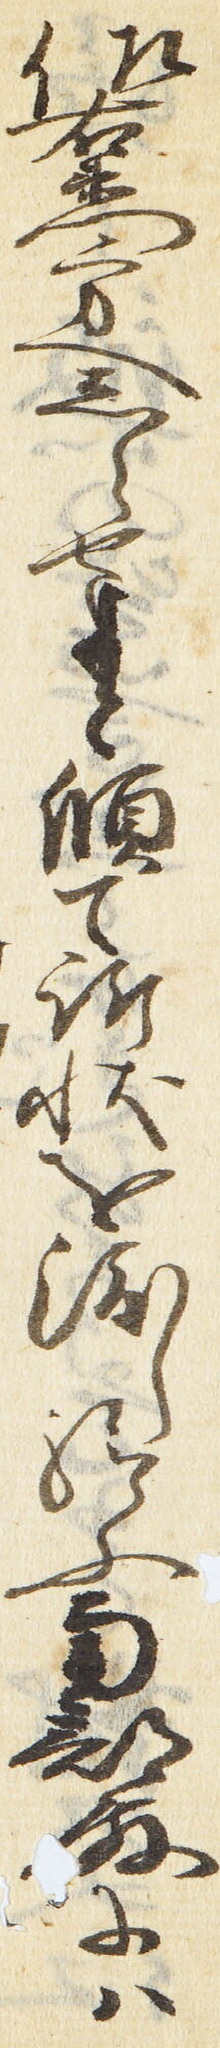佐右衛門方へしらせよと傾て訴状を渡し給ふ南部殿には
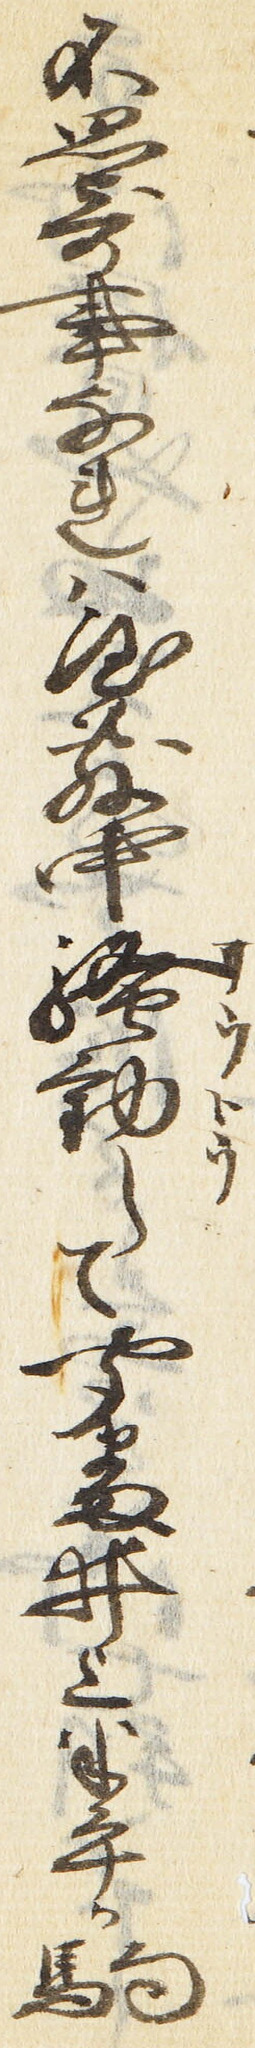不思奇事なれは屋敷中騒動して聞番井上半平か駒
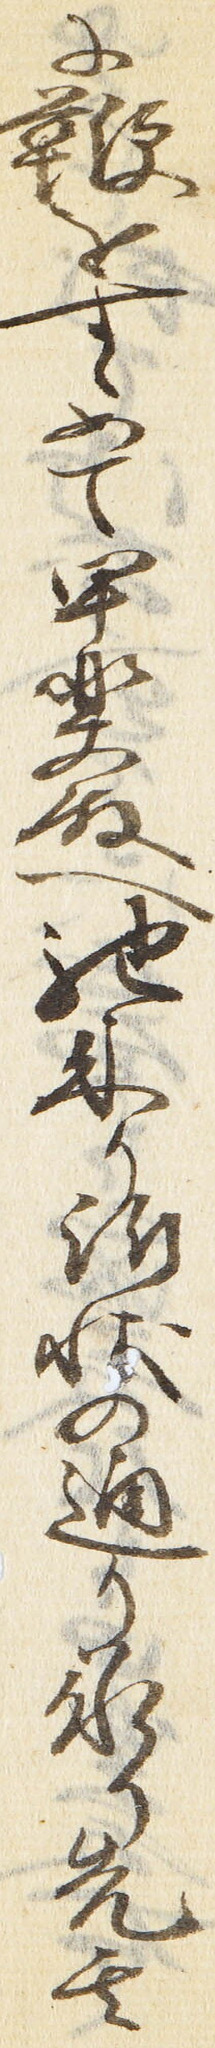に鞭をすゝめて甲斐殿へ馳来り訴状の通り承り先其
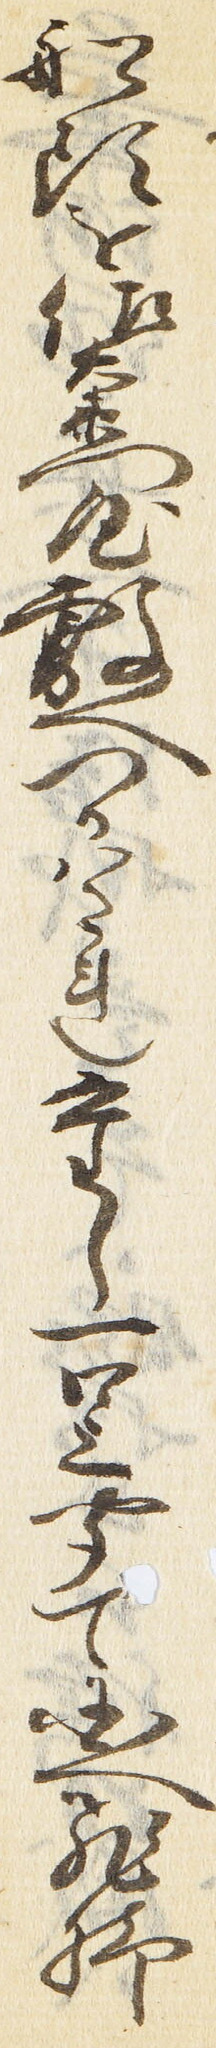船頭を佐右衛門屋敷へつかはされたし一口上聞て国へ飛脚
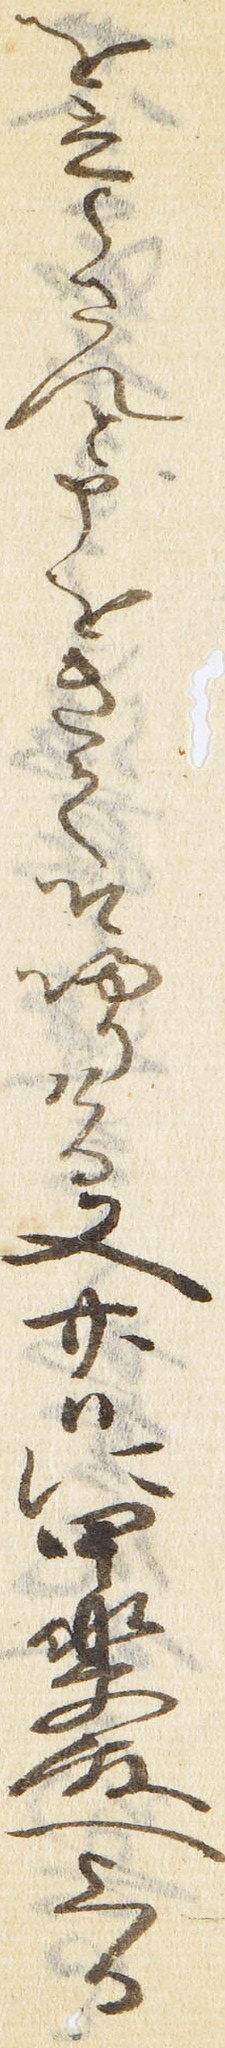を立申さんと申をきてそ帰りける又廿日に甲斐殿へ上る
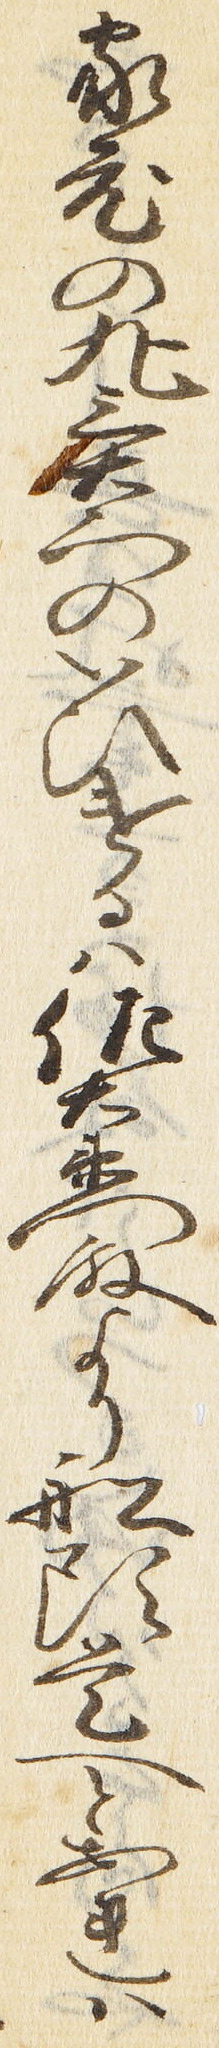家老の丸三右衛門のいひけるは佐右衛門殿より船頭是へとあれは
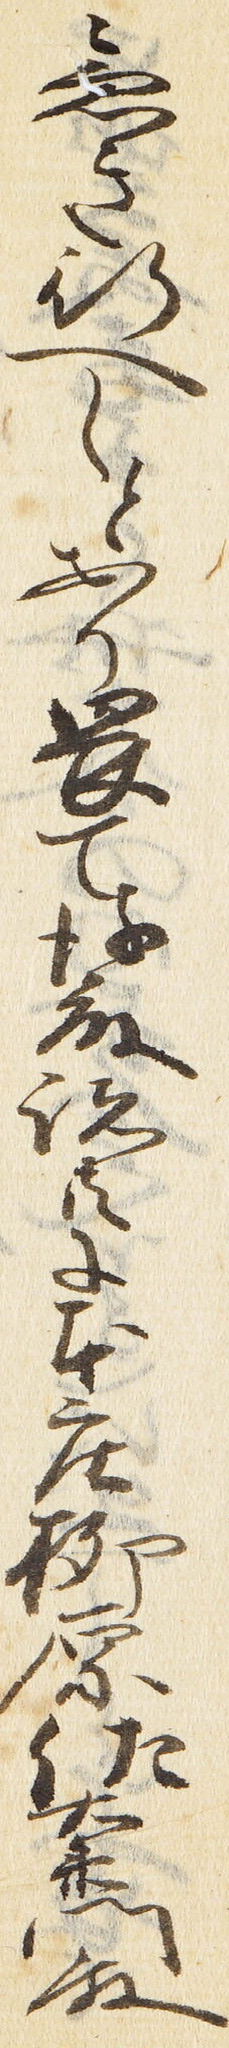急き行へしとあり畏て後藤諸共に本庄柳原佐右衛門殿
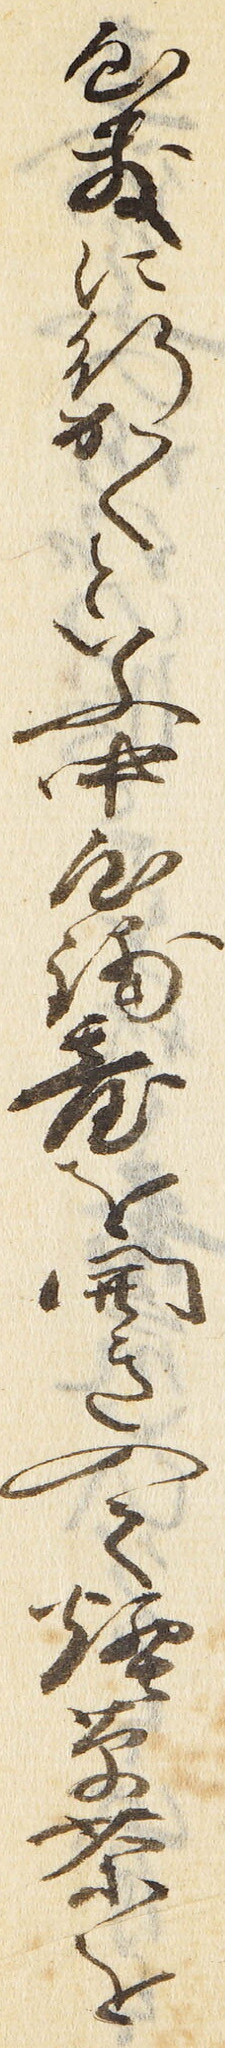屋敷に行かくといふ中屋鋪台を開き入て煙草茶を
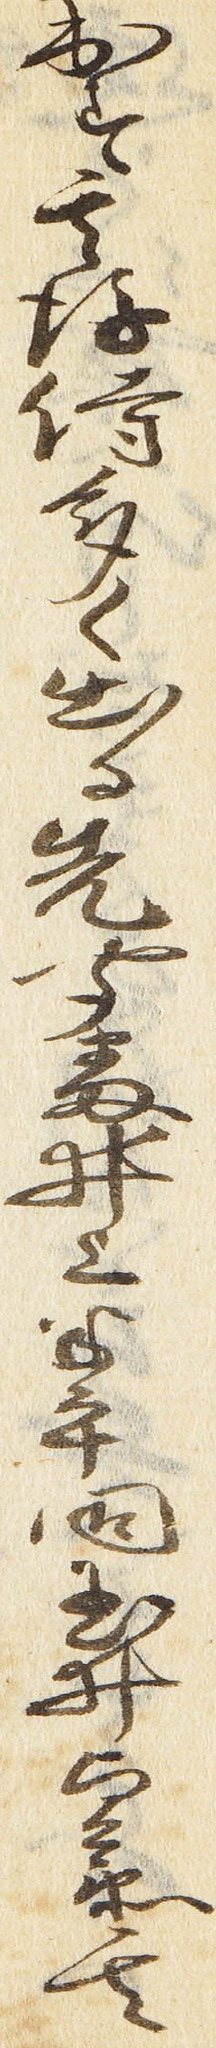出す其後侍多く出る先聞番井上半平同玉井与兵衛其
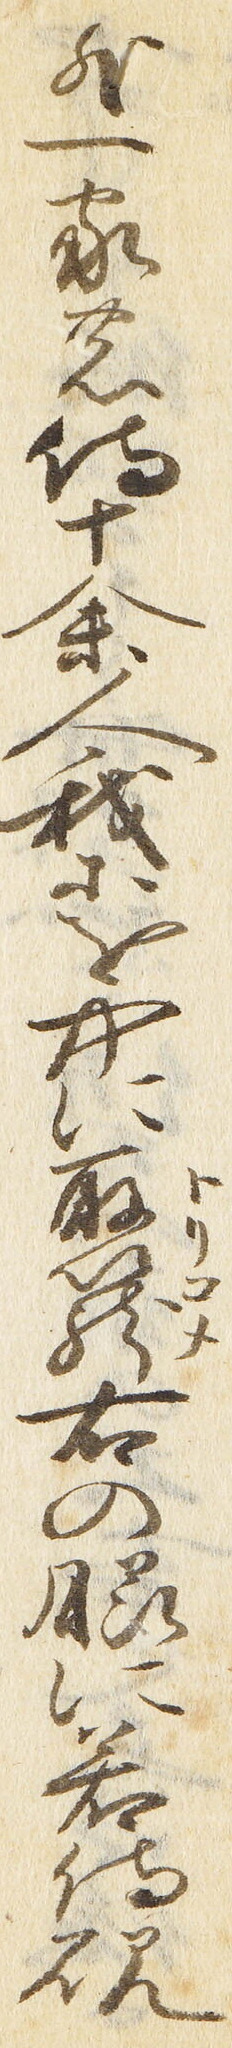外一家の侍十余人我等を中に取籠右の脇に若侍硯
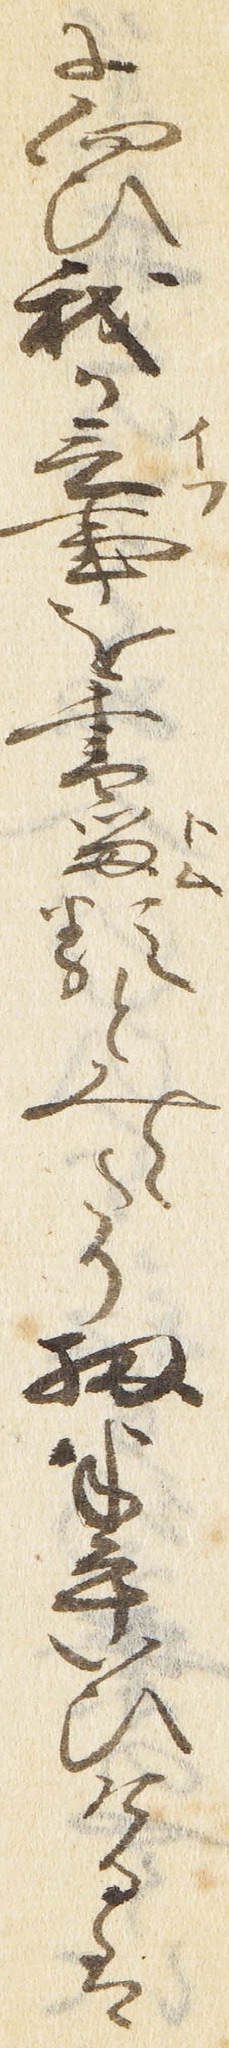に向ひ我か云事を書留るとみえたり扨半平いひけるは
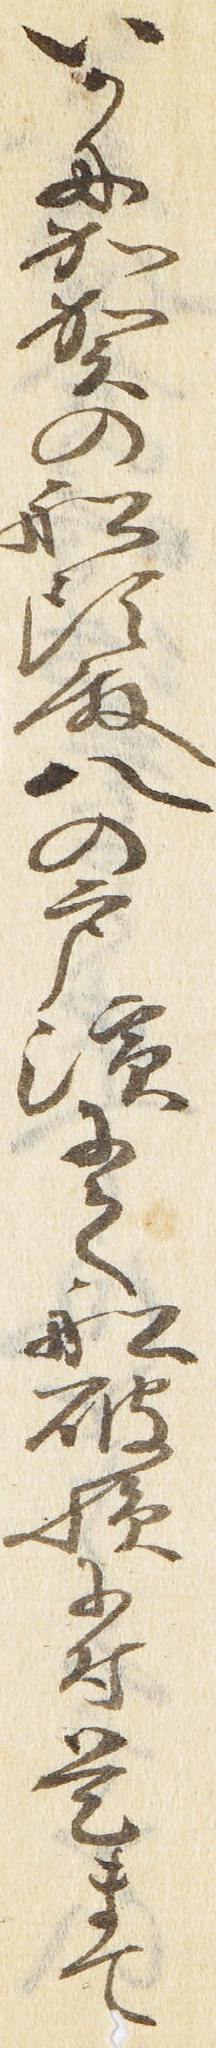いかに加賀の船頭殿八の戸浜にて船破損に付是まて
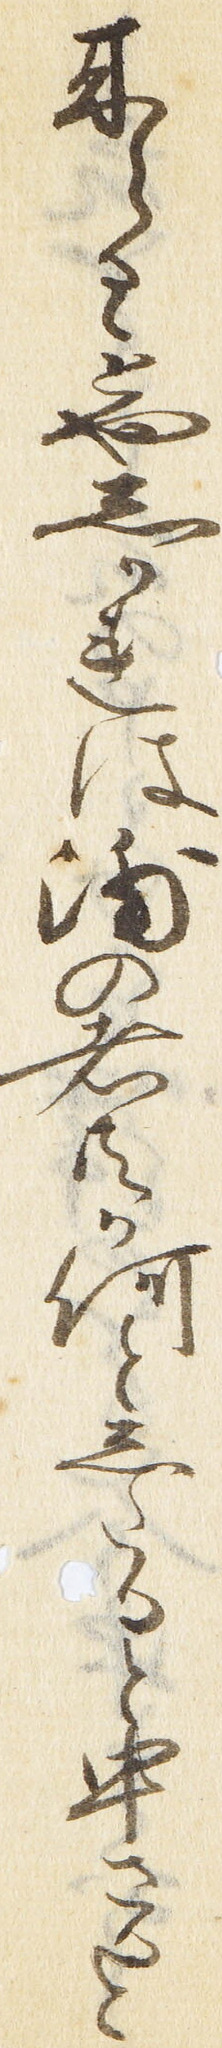来らるゝとやしかれは浦の者共か何としたると申さると
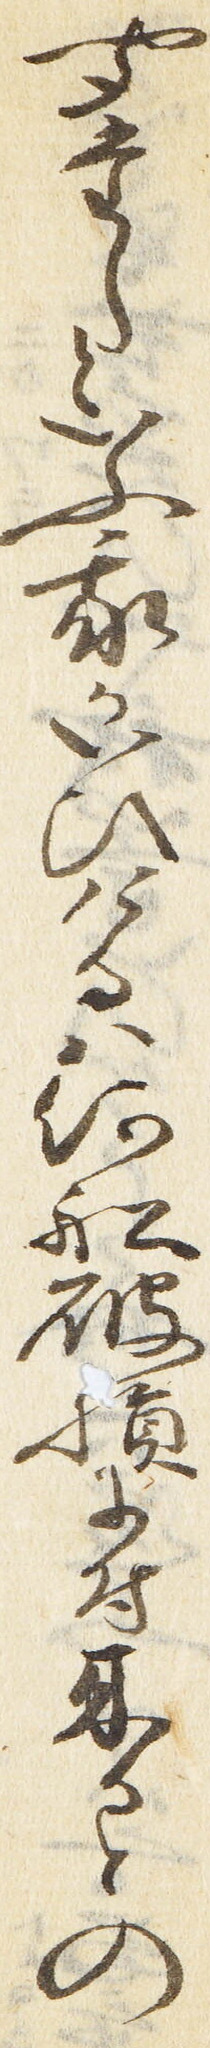聞たしといふ我かいひけるは何船破損に付来るとの
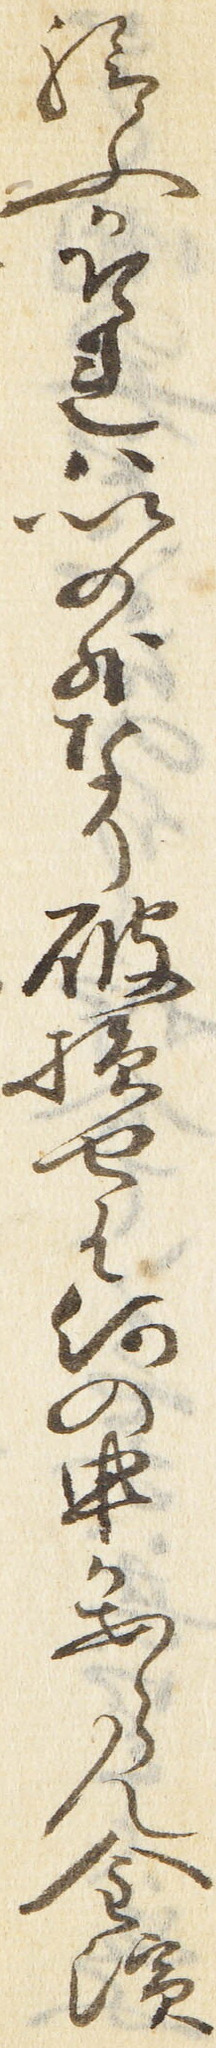給ふかそれは以の外なり破損せは何の申かあらん金浜
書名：海陸世話日記
